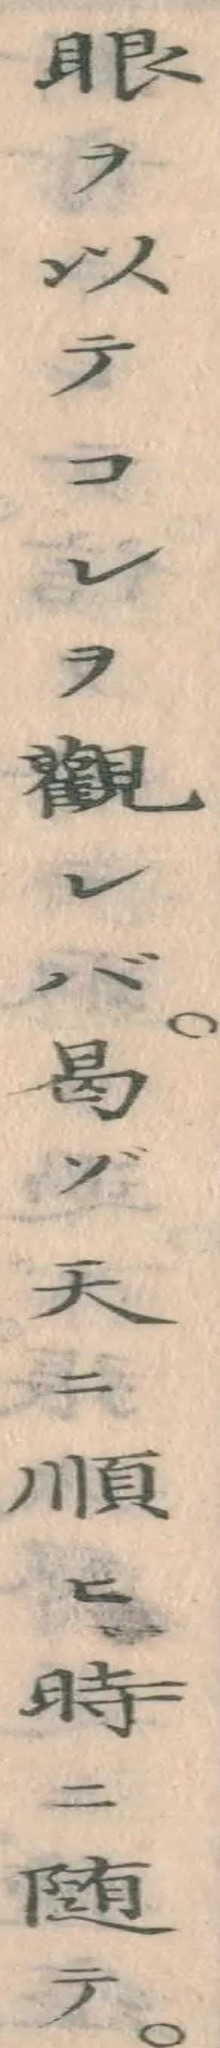眼ヲ以テコレヲ観レバ。曷ゾ天ニ順ヒ時ニ随テ。
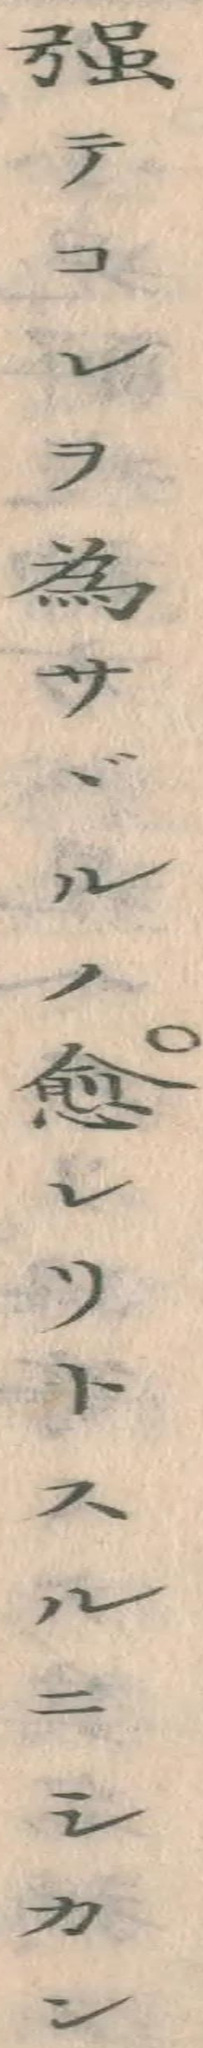強テコレヲ為サヾルノ。愈レリトスルニシカン
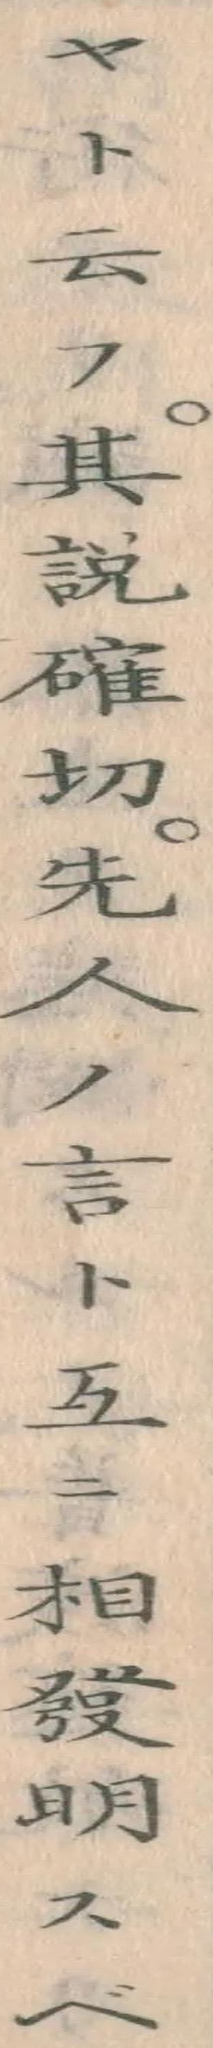ヤト云フ。其説確切。先人ノ言ト互ニ相発明スベ
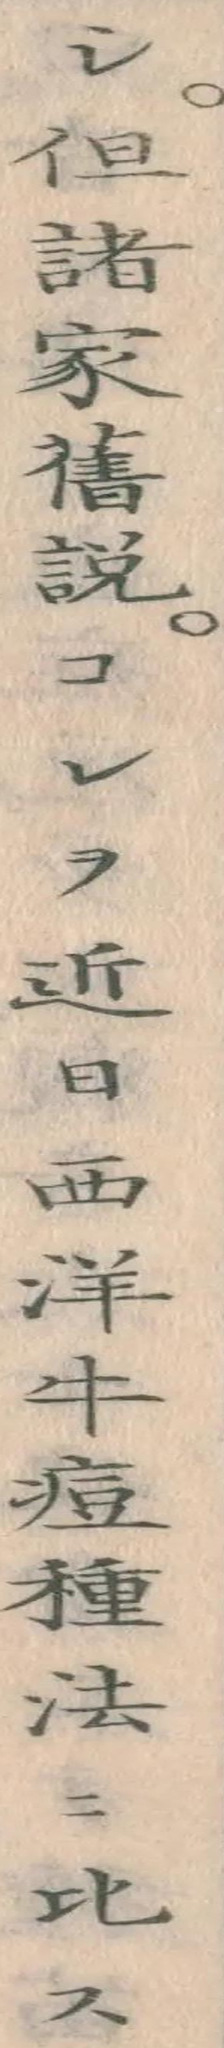シ。但諸家旧説。コレヲ近日西洋牛痘種法ニ比ス
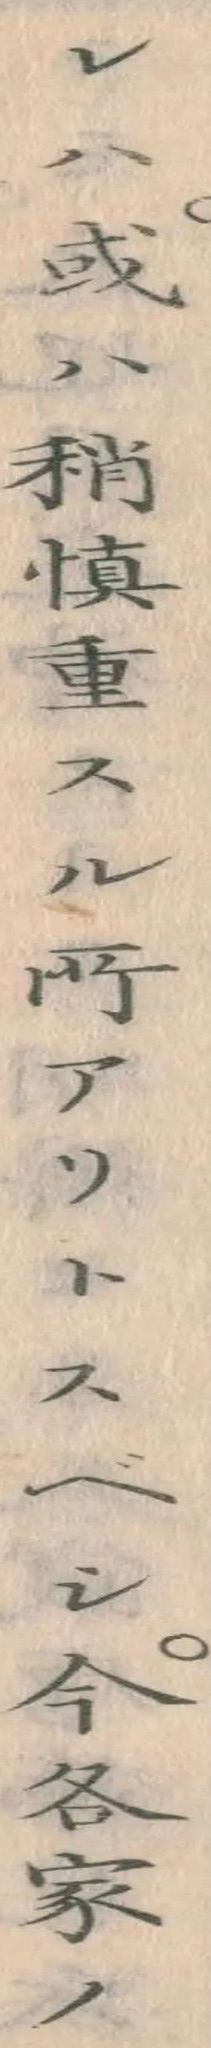レハ。或ハ稍慎重スル所アリトスベシ。今各家ノ
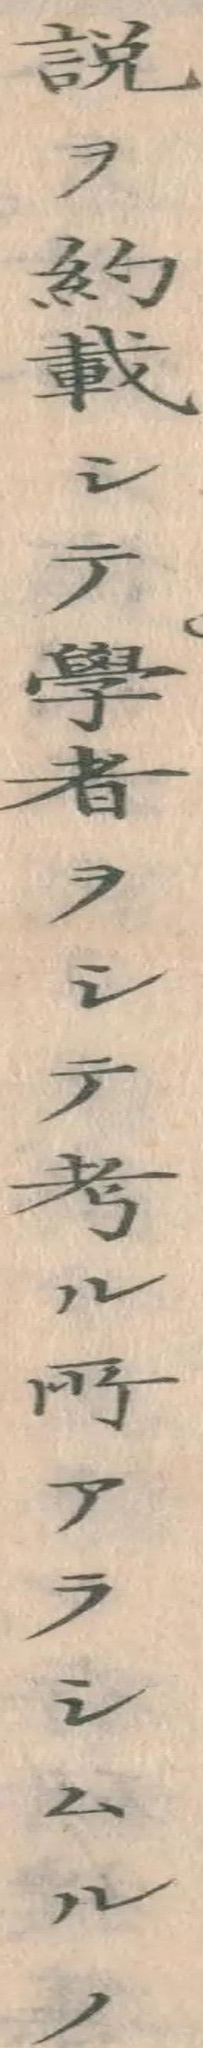説ヲ約載シテ。学者ヲシテ考ル所アラシムルノ
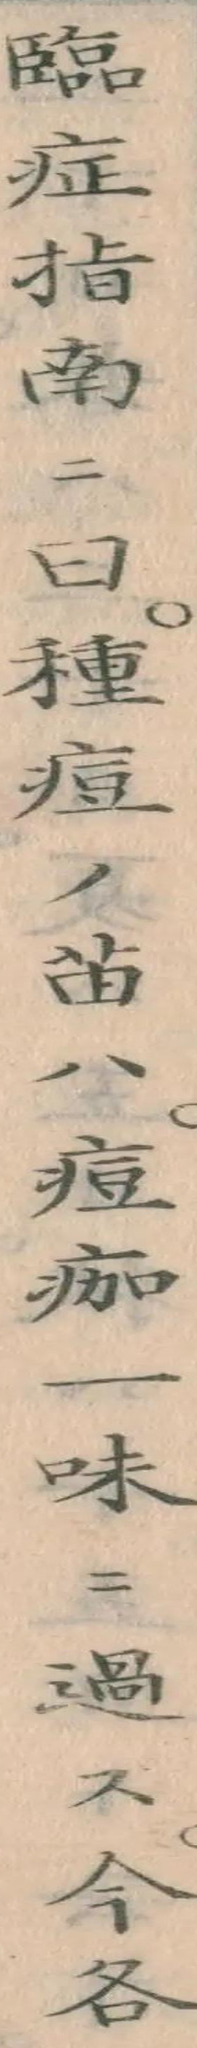臨症指南ニ曰。種痘ノ苗ハ。痘痂一味ニ過ス。今各
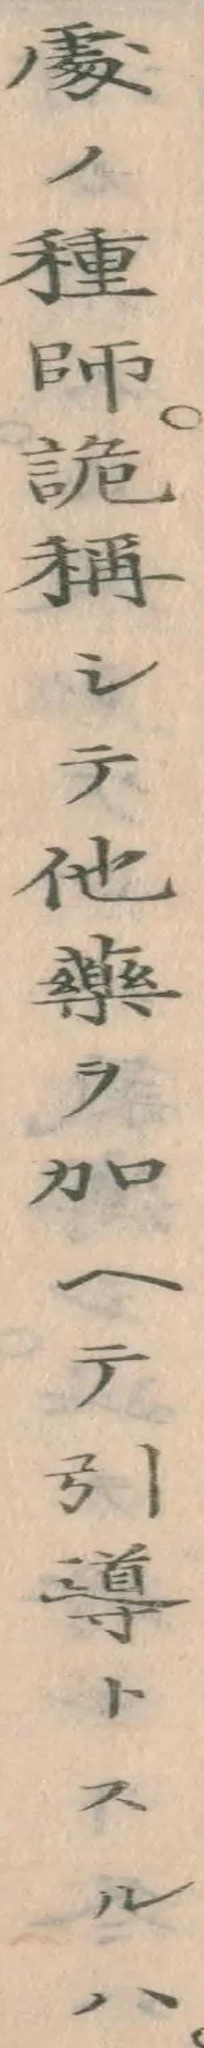処ノ種師。詭称シテ他薬ヲ加ヘテ引導トスルハ。
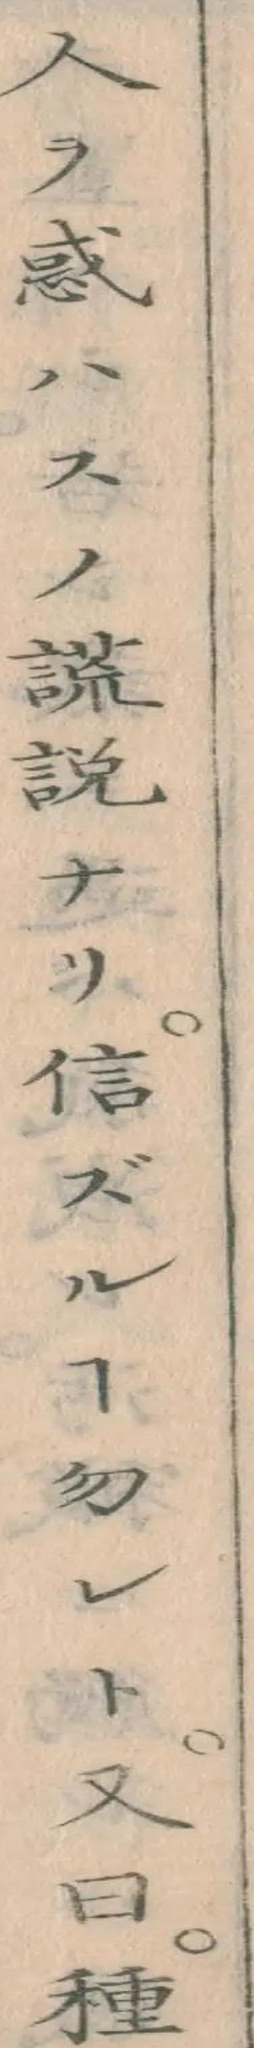人ヲ惑ハスノ謊説ナリ。信ズルヿ勿レト。又曰。種
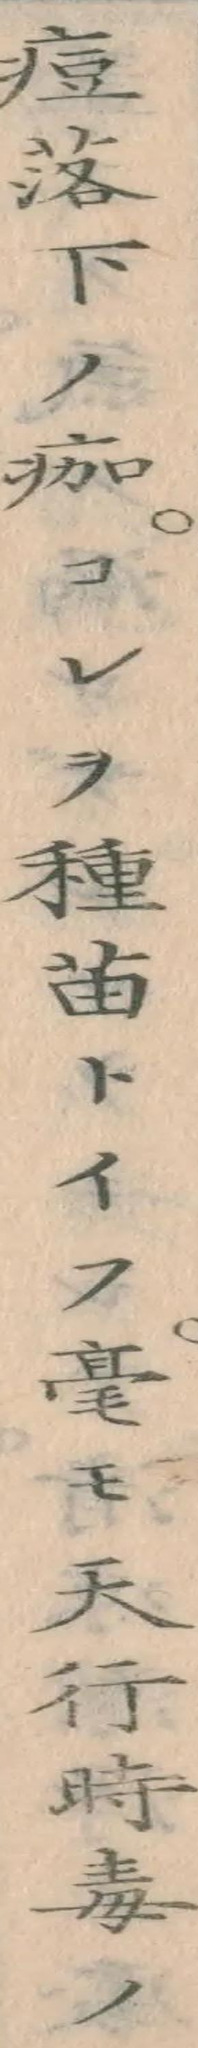痘落下ノ痂。コレヲ種苗トイフ。毫モ天行時毒ノ
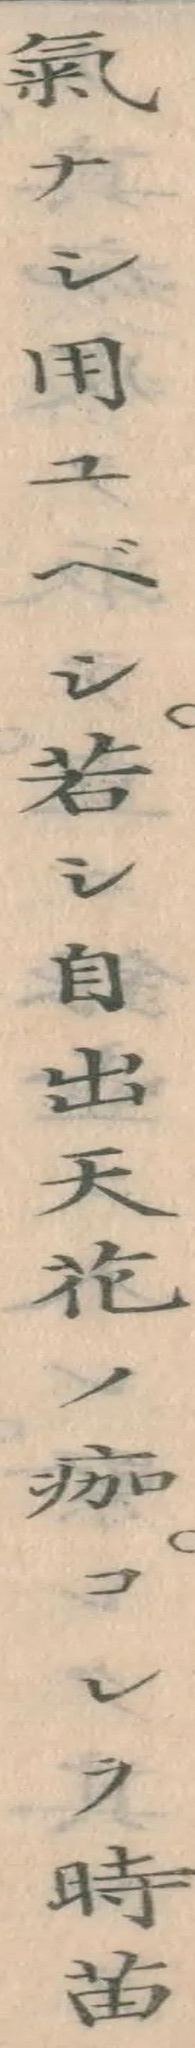気ナシ用ユベシ。若シ自出天花ノ痂。コレヲ時苗
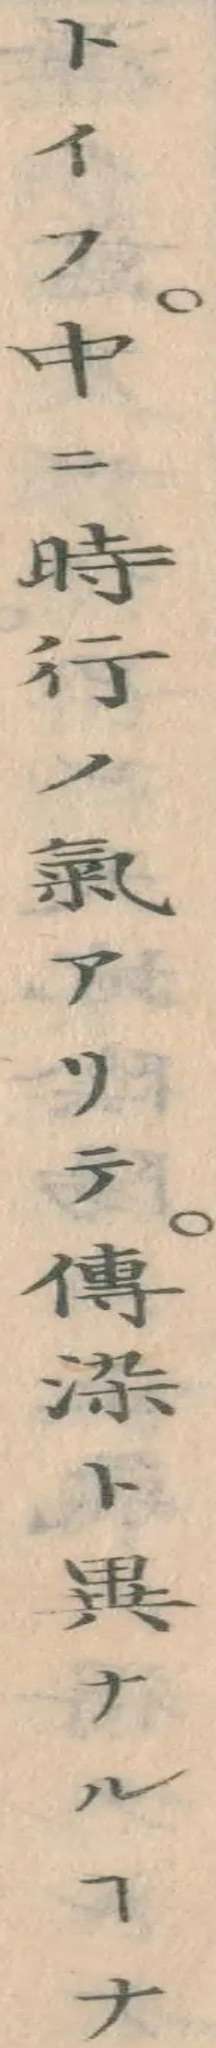トイフ。中ニ時行ノ気アリテ。伝染ト異ナルヿナ
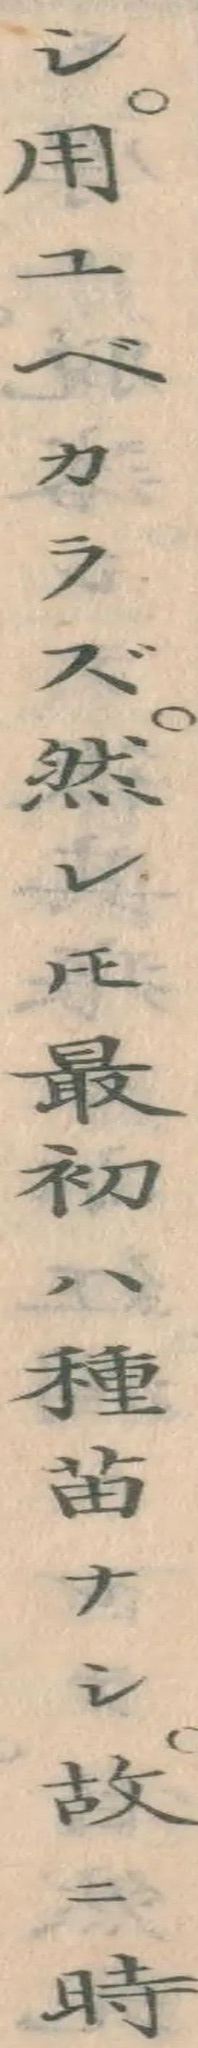シ。用ユベカラズ。然レ𪜈最初ハ種苗ナシ。故ニ時
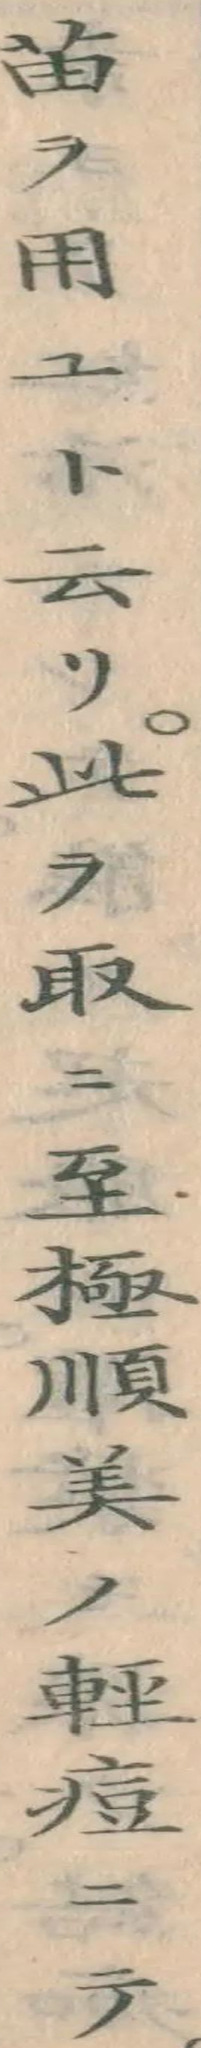苗ヲ用ユト云リ。此ヲ取ニ至極順美ノ軽痘ニテ。
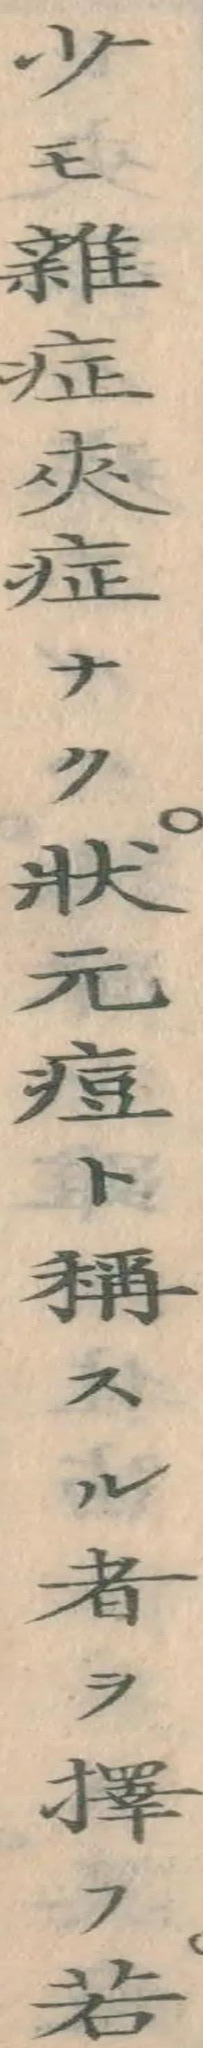少モ雑症夾症ナク。状元痘ト称スル者ヲ択フ。若

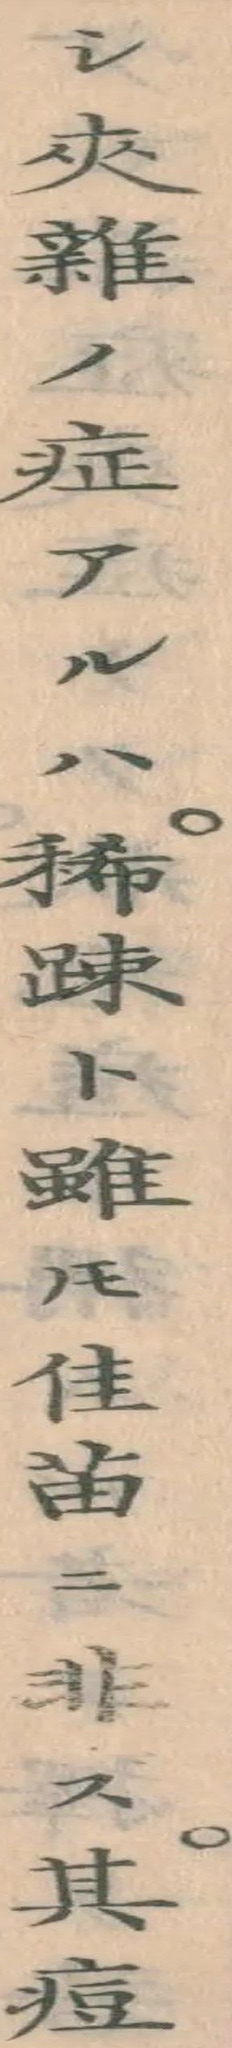シ夾雑ノ症アルハ。稀踈ト雖𪜈佳苗ニ非ス。其痘
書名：種痘弁義
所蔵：国立国会図書館 National Diet Library, JAPAN
